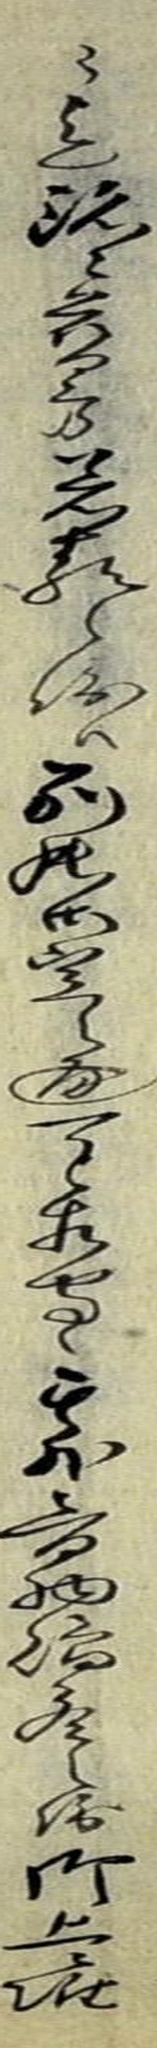々迄銘々暮方着類之儀は別紙御定之通可被相守候其外音物贈答之儀御上に准
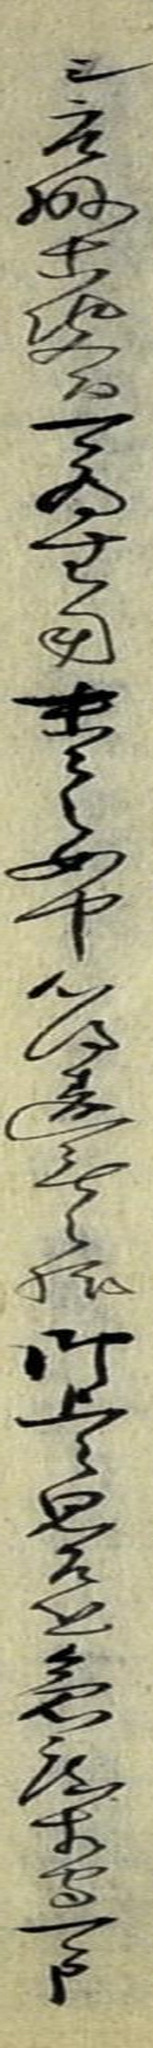し取扱等決而可為無用末々之女中心得違無之様御上之思召を急度相守可申
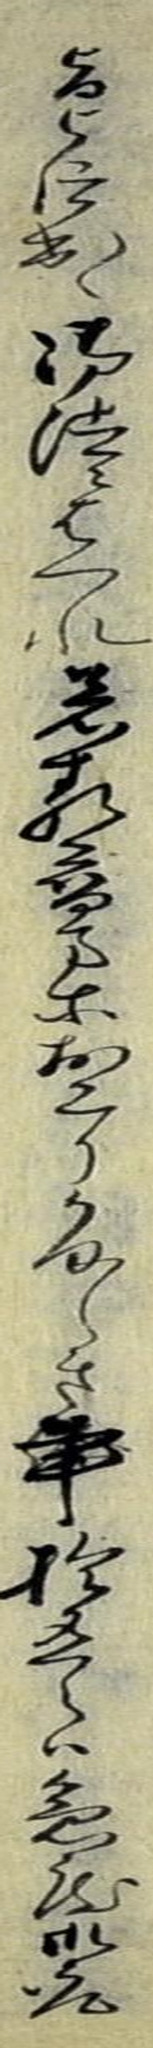旨被仰出候御法にはつれ着類暮方等おこりかましき事於有之は急度御取
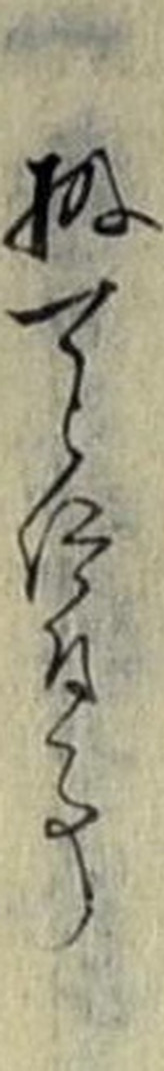扱可被仰付事
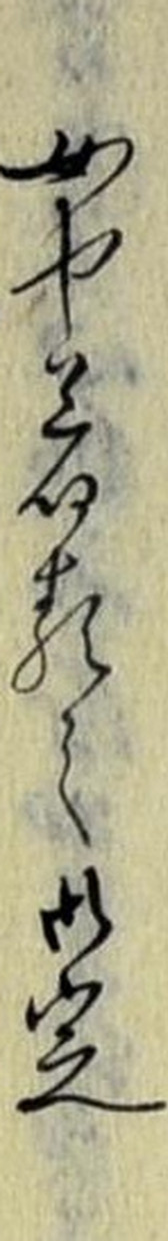女中着類之御定
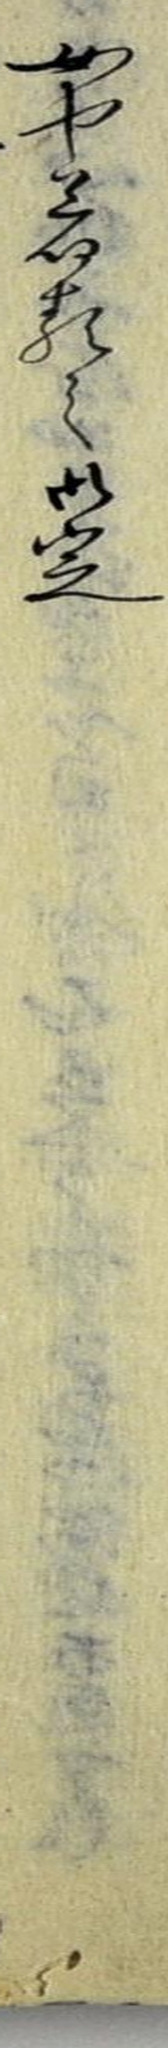女中着類之御定
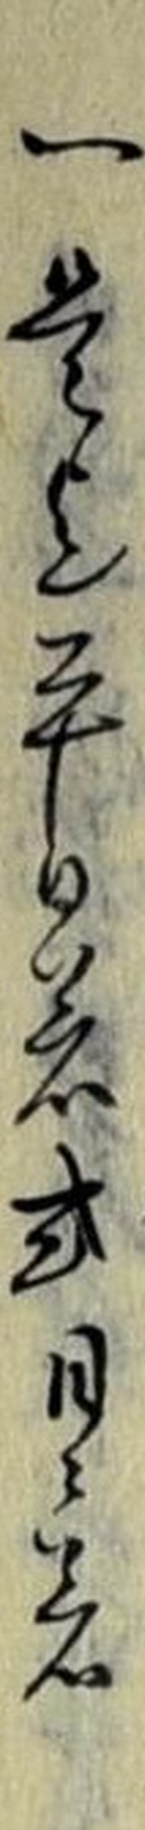一是迄平日着式日に着
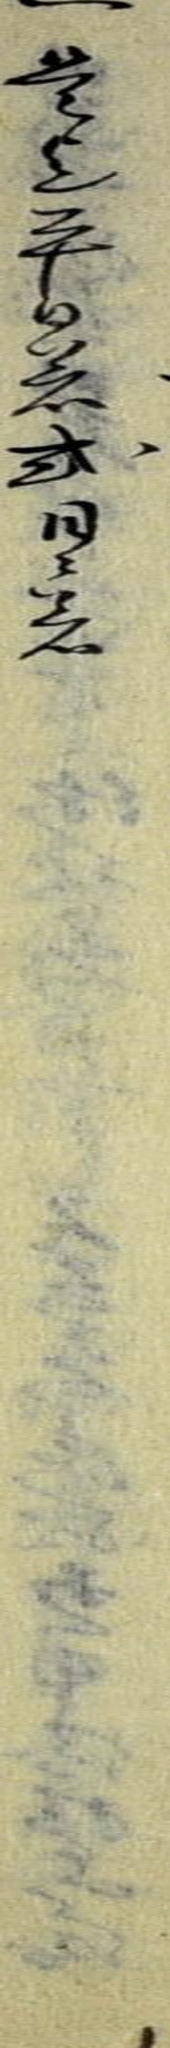一是迄平日着式日に着
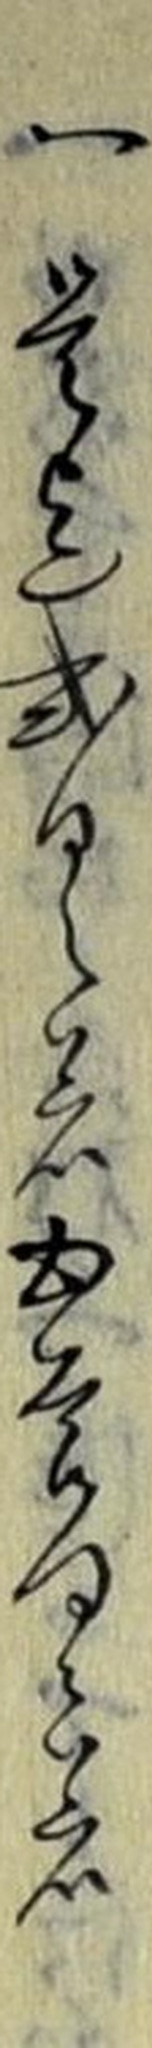一是迄式日之着五節句に着
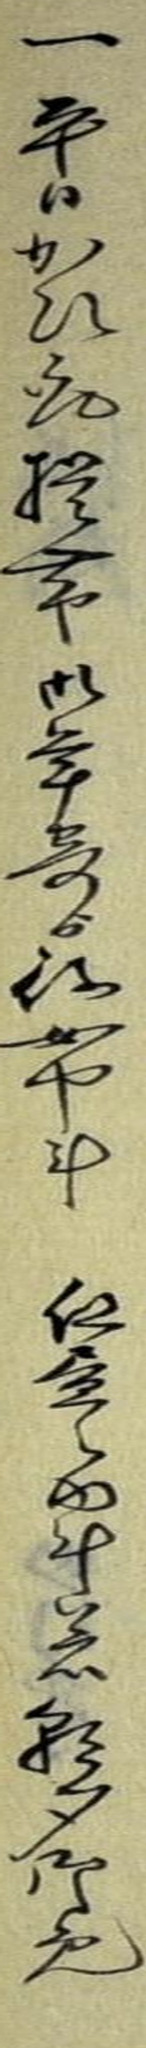一平日かひ取提帯御年寄ゟ役女中斗但御昼之内斗着朝夕御免
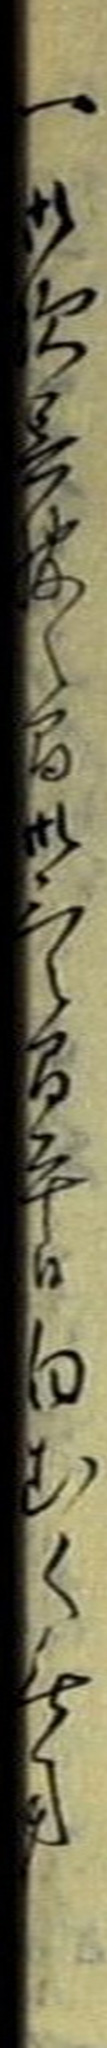一御次呉服之間御三之間平日白むく無用
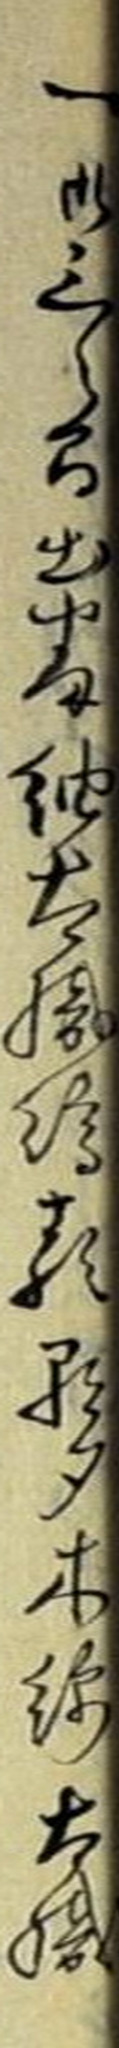一御三之間出番紬太織嶋類朝夕木綿太織
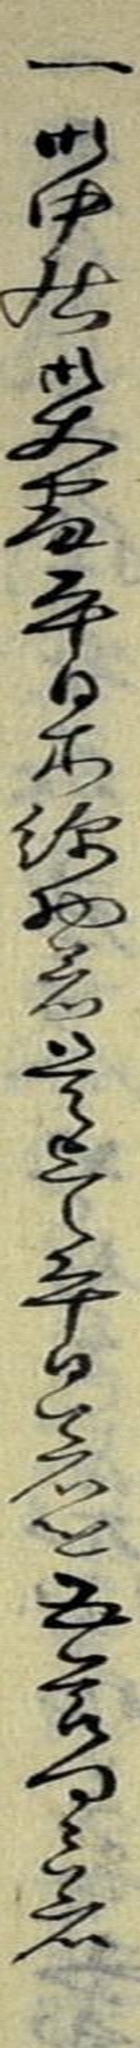一御中居御使番平日木綿物着是迄之平日着を五節句に着
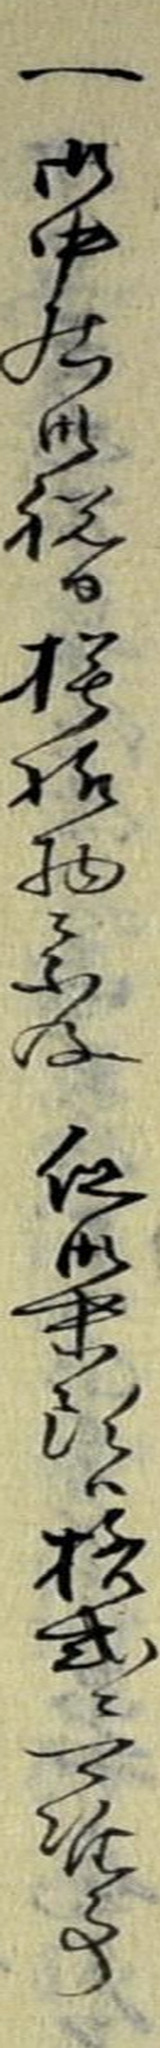一御中居御祝日模様物に不及但御末頭は格式に可准事
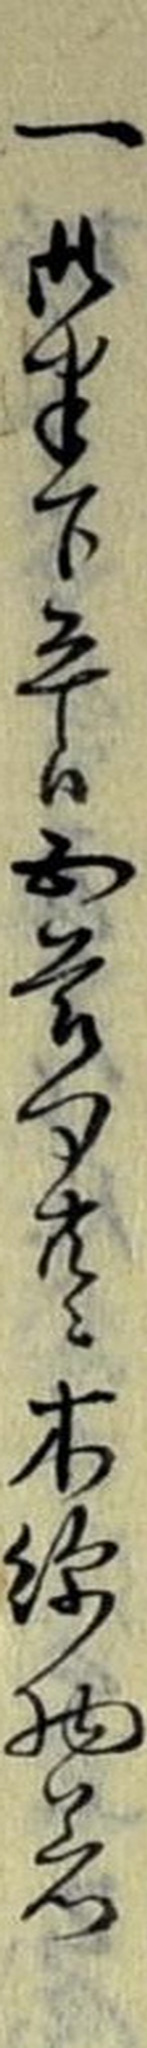一御半下平日五節句共に木綿物着
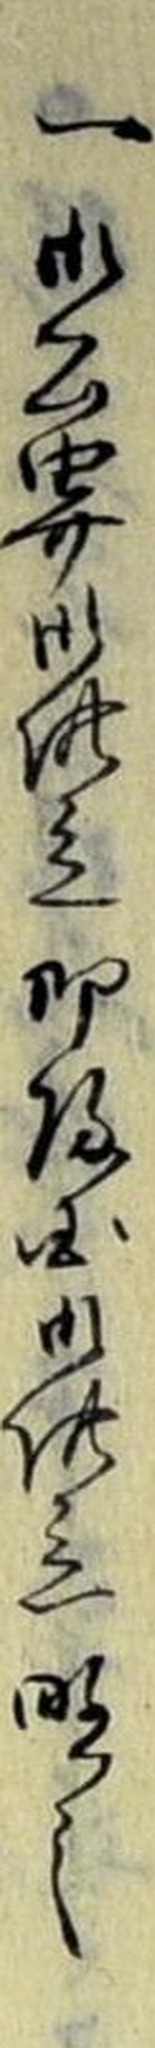一御公界御供立御帰国御供立略之
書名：命令之部 二
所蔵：福井県文書館 Fukui Prefectural Archives
